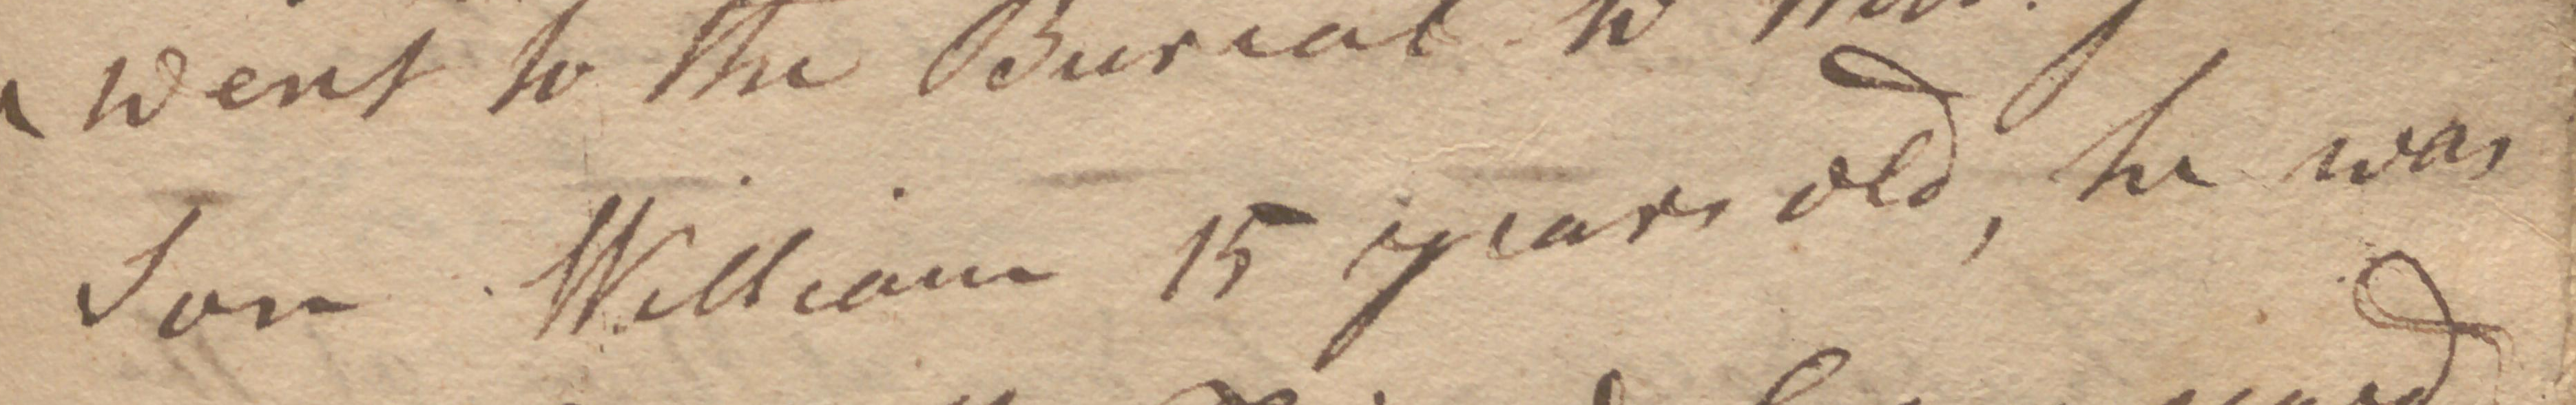Son William 15 years old, he was
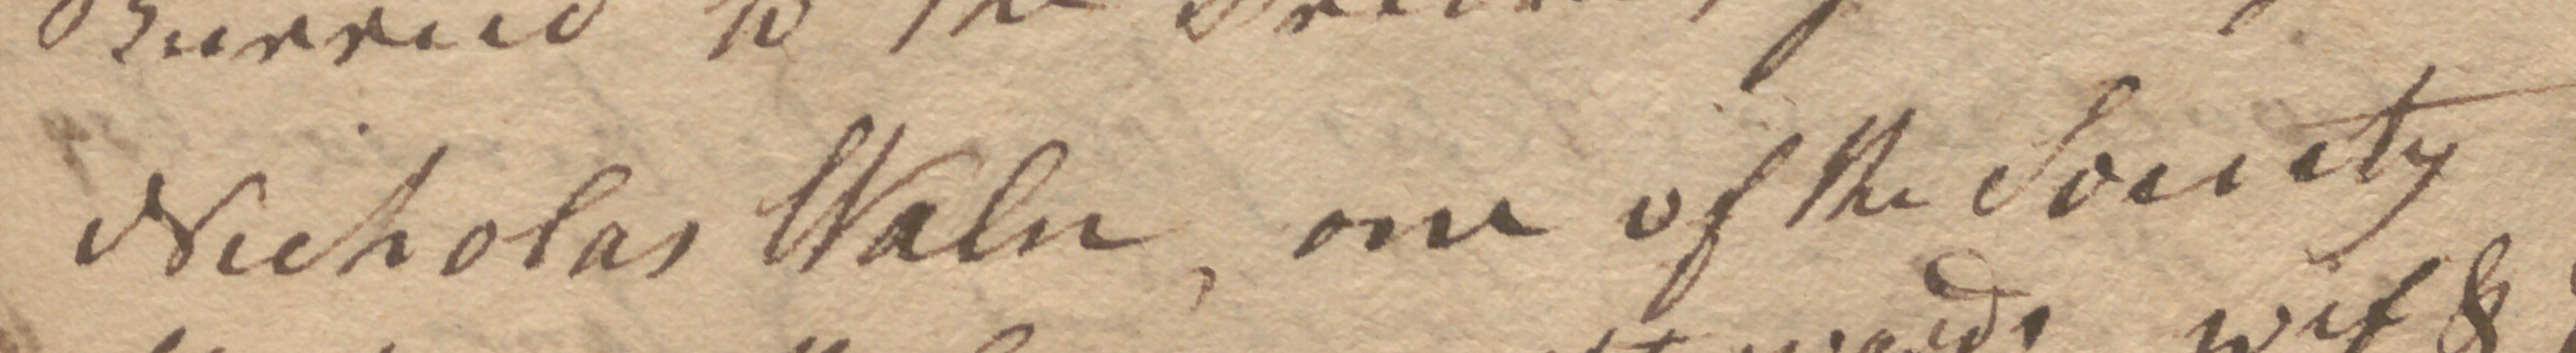Nicholas Waln one of the Society
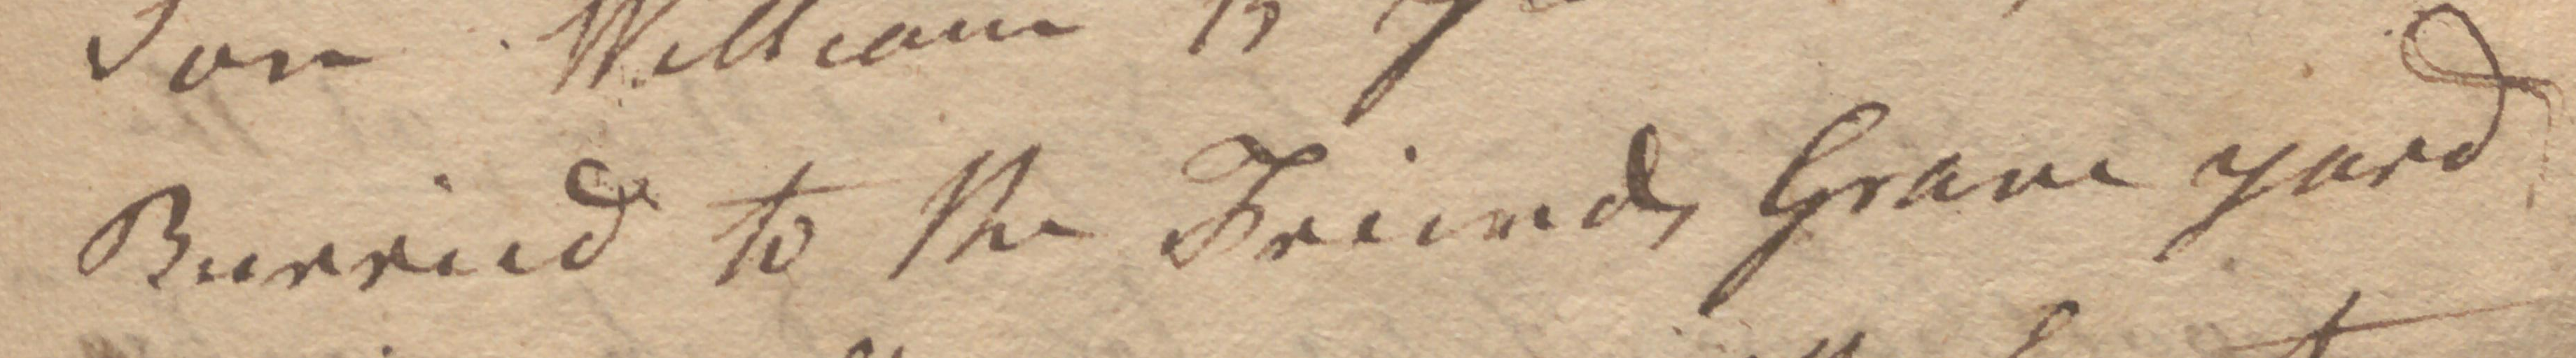Burried to the Friends Grave yard
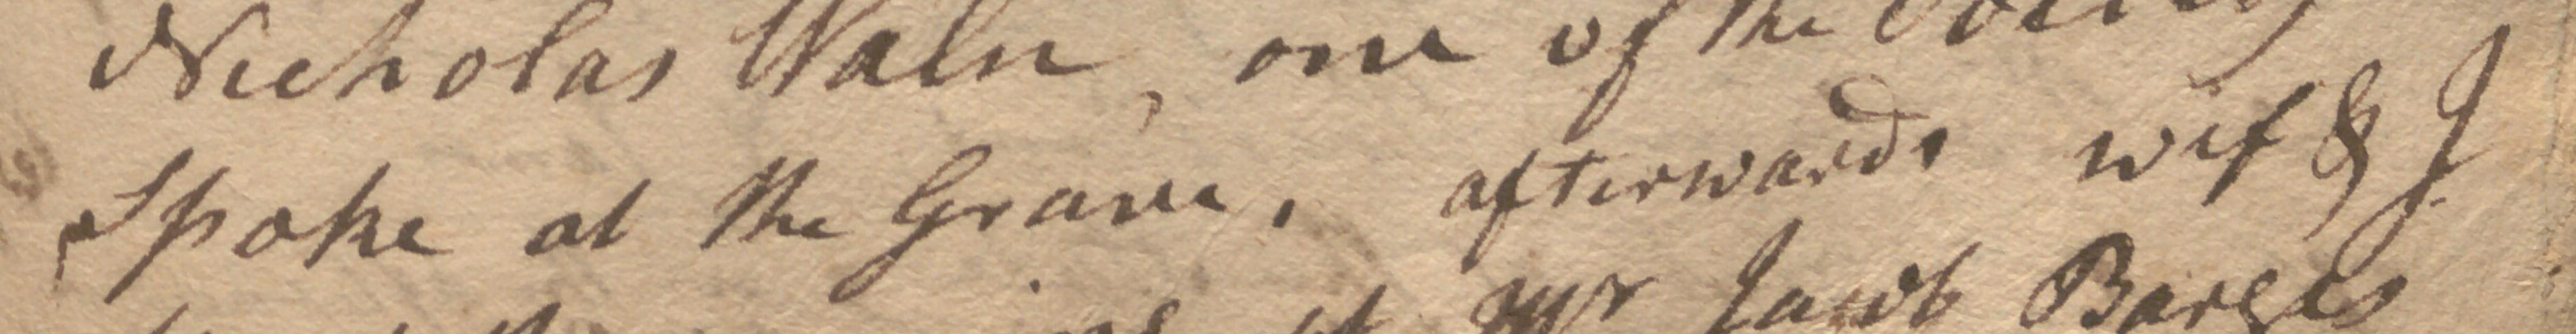spoke at the Grave, afterwards wif & I
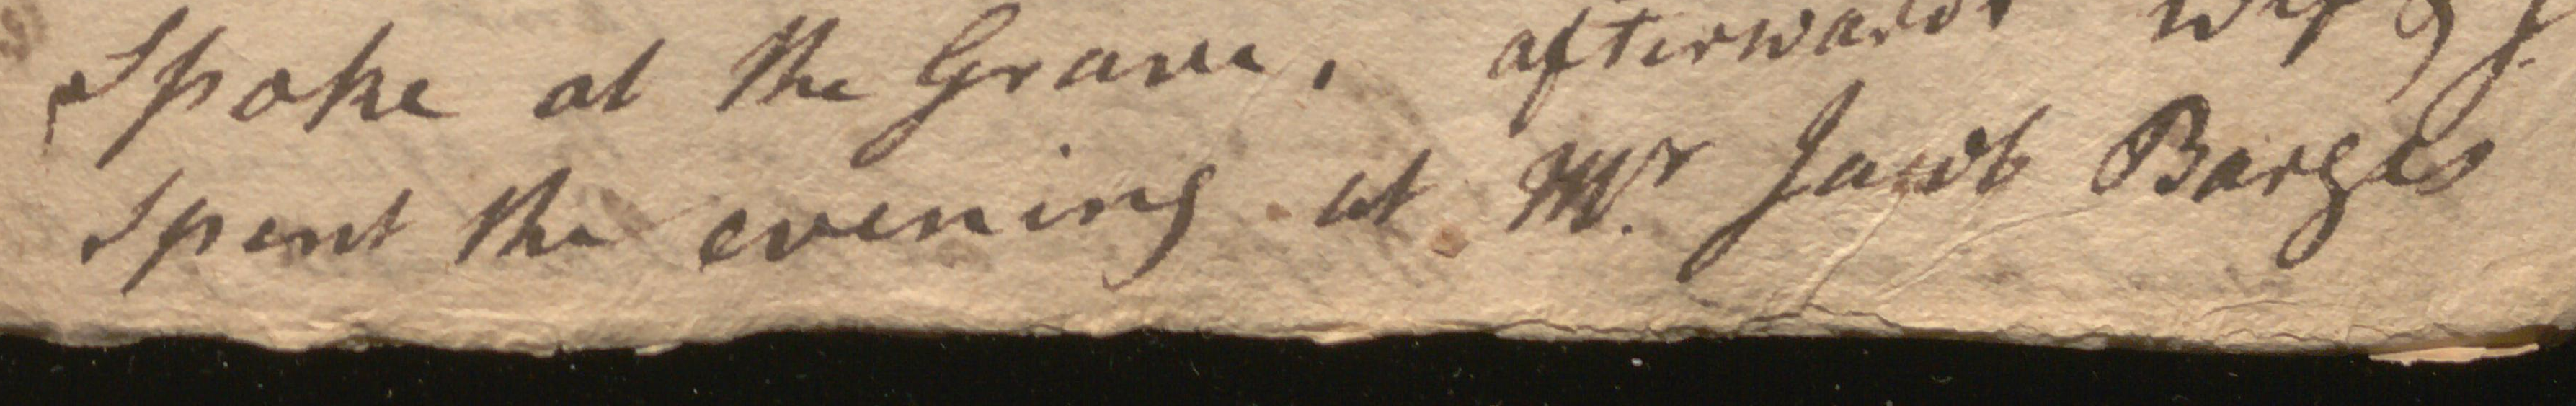spint the evening at M^r. Jacob Barges
